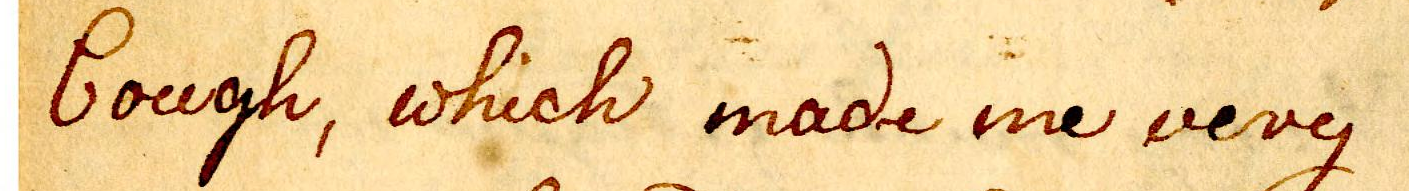Cough, which made me very
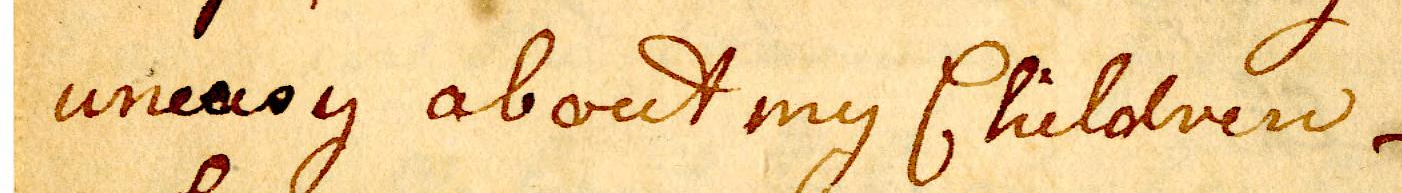uneasy about my Children
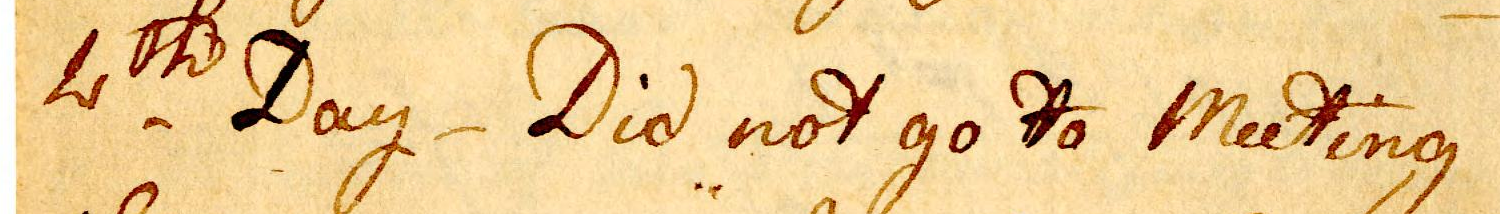4^th Day- Did not go to Meeting
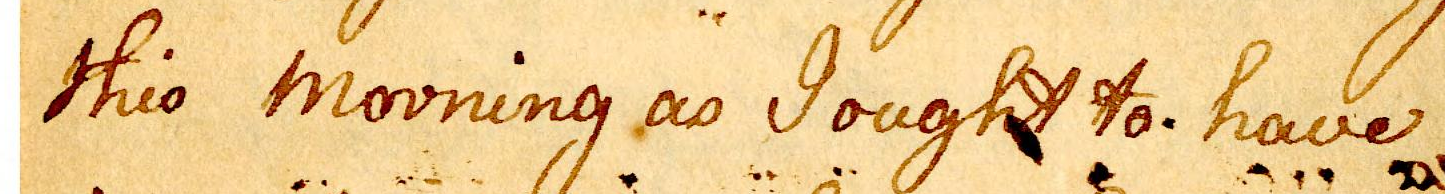this Morning as I ought to have
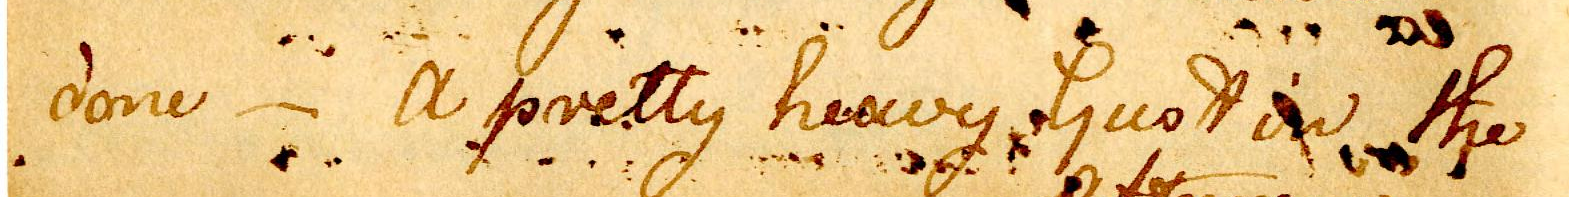done- A pretty heavy Gust in the
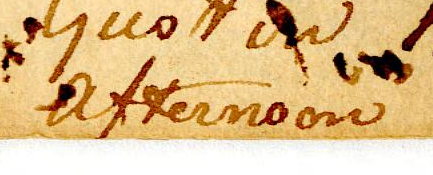Afternoon
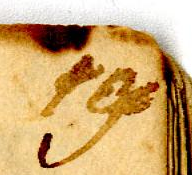19
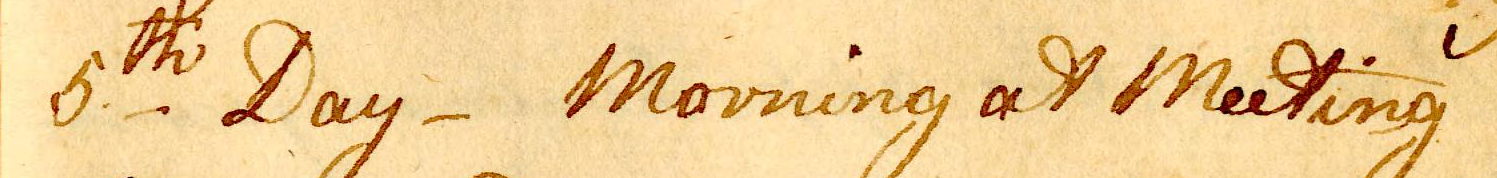5^th Day- Morning at Meeting
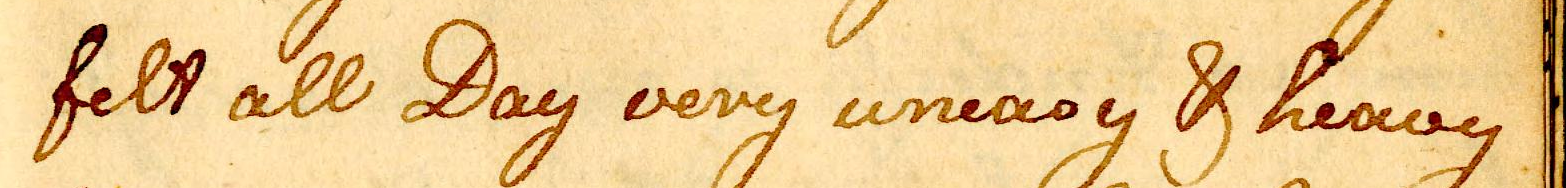felt all Day very uneasy & heavy
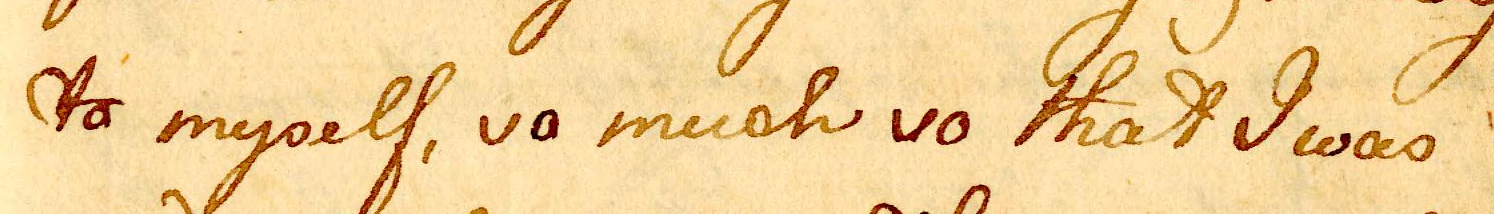to myself, so much so that I was
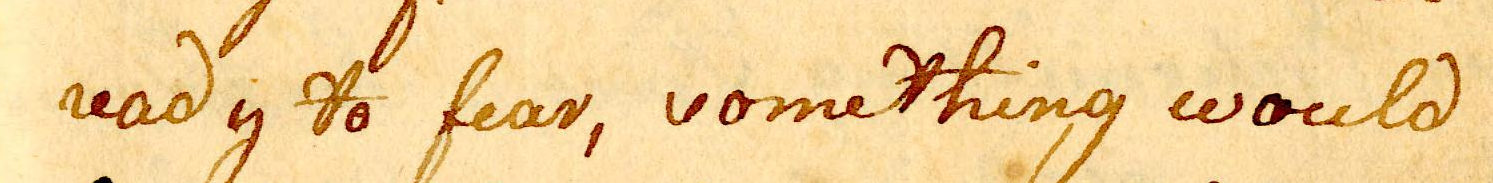ready to fear, something would
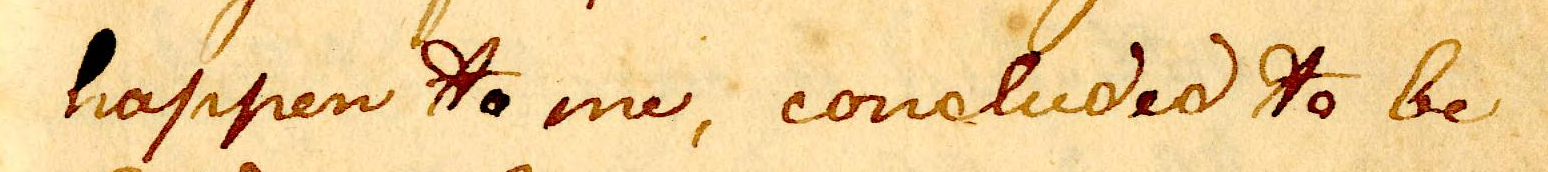happen to me, concluded to be
